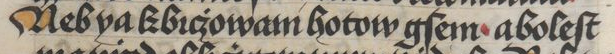Neb ya k bicżowaní hotow gſem.a boleſt
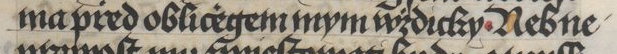ma pṙed obliċegem mym wżdicky.Neb ne¬
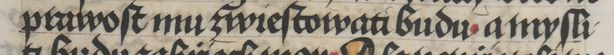prawoſt mu zwieſtowati budu.a myſli¬
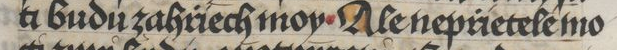ti budu zahṙiech moy.Ale nepṙíetelé mo¬
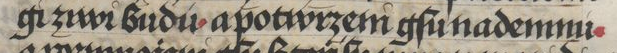gi ziwi budú.a potwrzeni gſu nademnú.
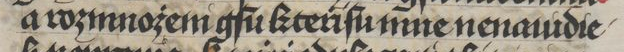a rozmnożeni gſu kteṙíſu mne nenaudie¬
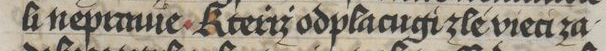li neprauie.Kteṙiż odplacugí zlé vieci za¬
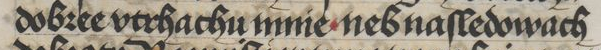dobree vtrhachu mnie.neb naſledowach
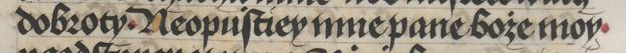dobroty.Neopuẛtiey mne pane boże moy.
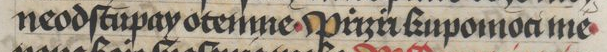neodſtupay otemne.Pṙizṙi kupomoci mé
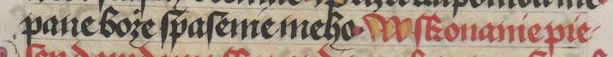pane boże ſpaſeníe meho.Wſkonanie pie¬
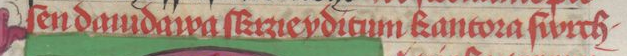ſen dauidawa ſkrzie yditum kantora ſwrch¬
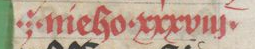.ž.níeho.xxxviij.
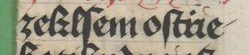zeklſem oſtṙie¬
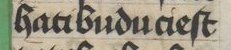hati budu cieſt
